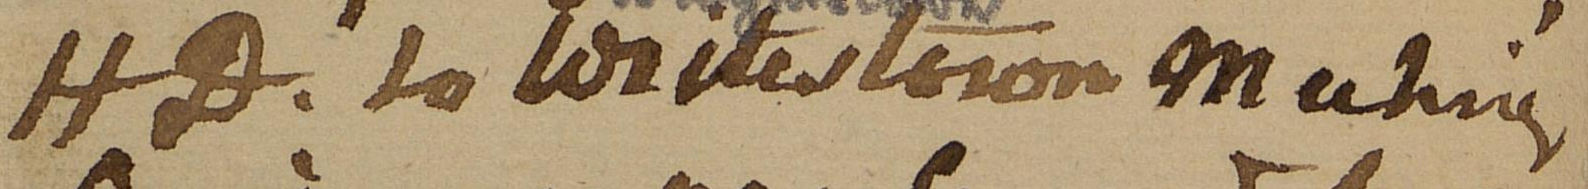HD. to Writestown Meeting
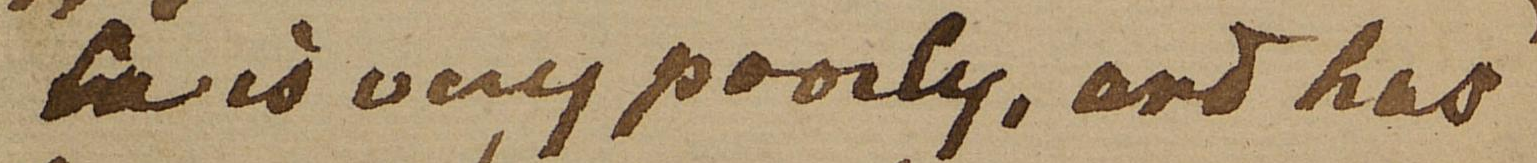he is very poorly, and has
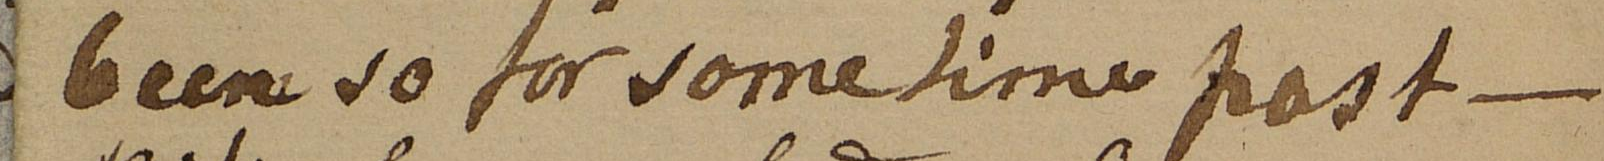been so for sometime past-
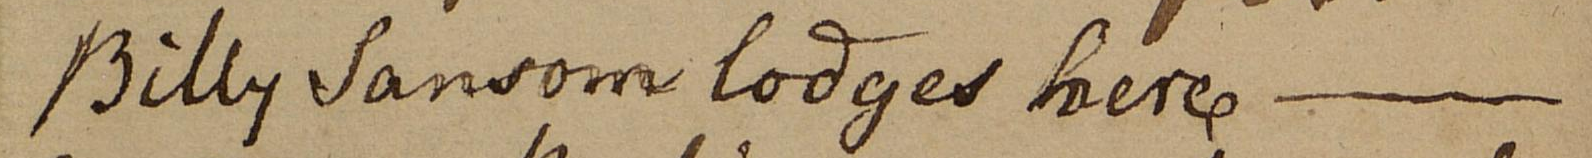Billy Sansom lodges here-
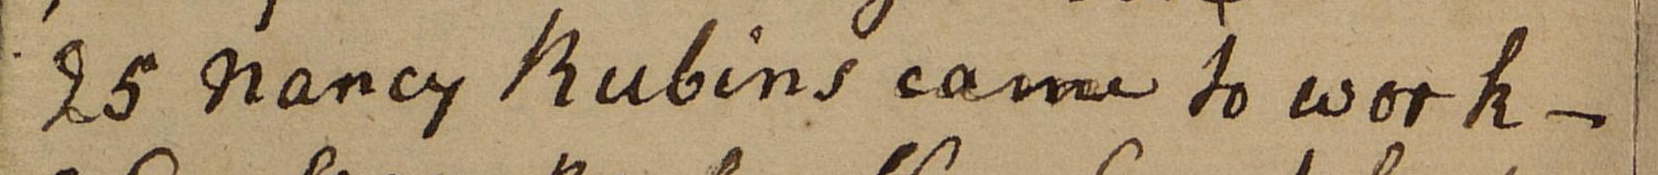25 Nancy Rubins came to work-
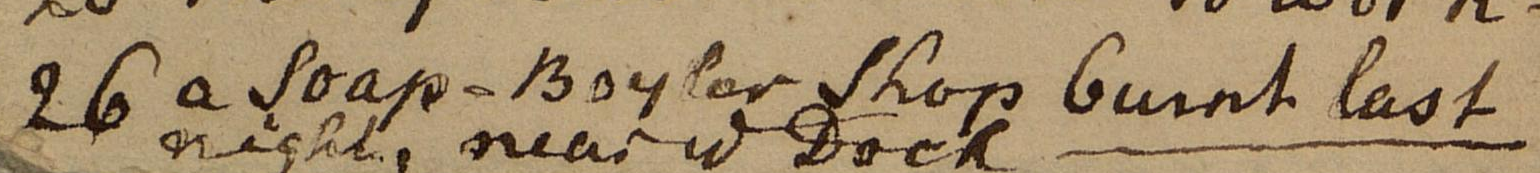26 a Soap- Boylar Shop burnt last
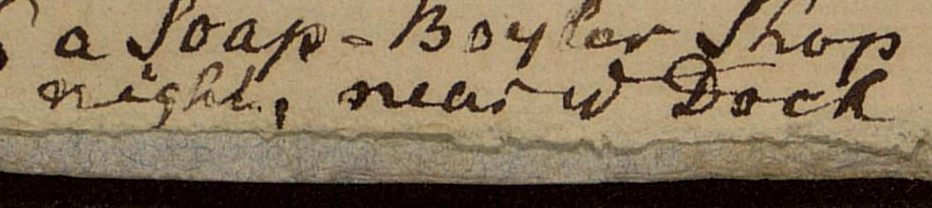night, near y^e Dock
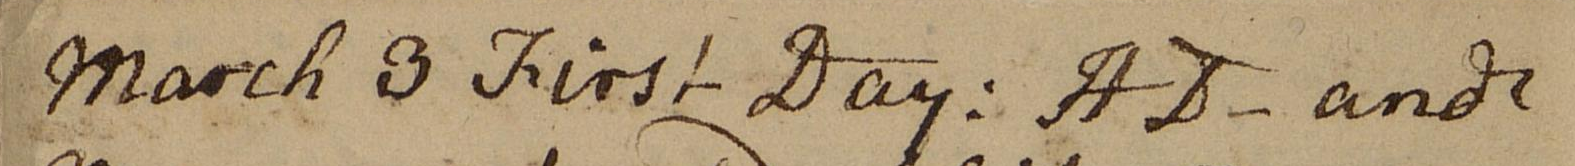March 3 First Day: HD- and
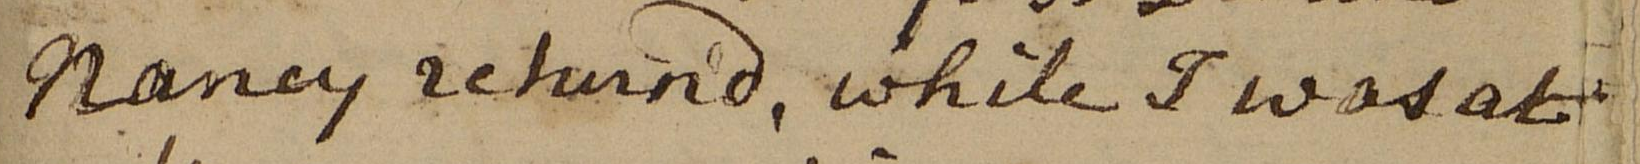nancy return'd, while I was at
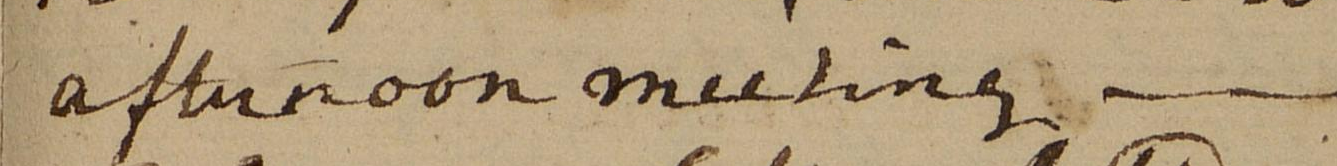afternoon meeting-
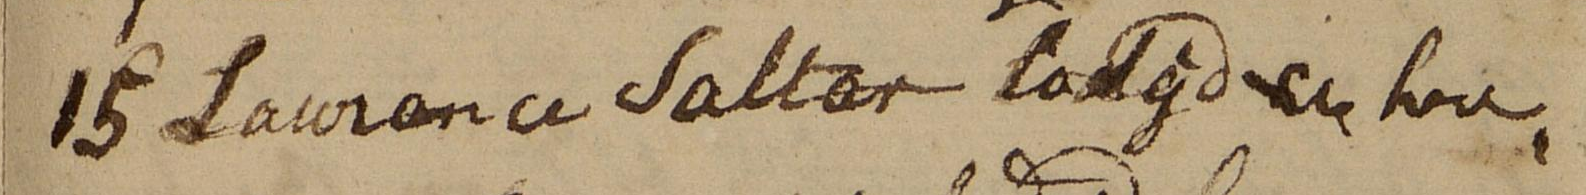15 Lawrance Saltar lodg'd &c here,
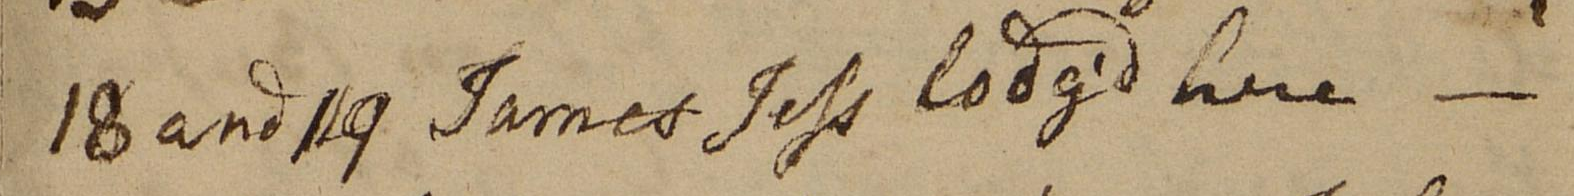18 and 19 James Jess lodg'd here-
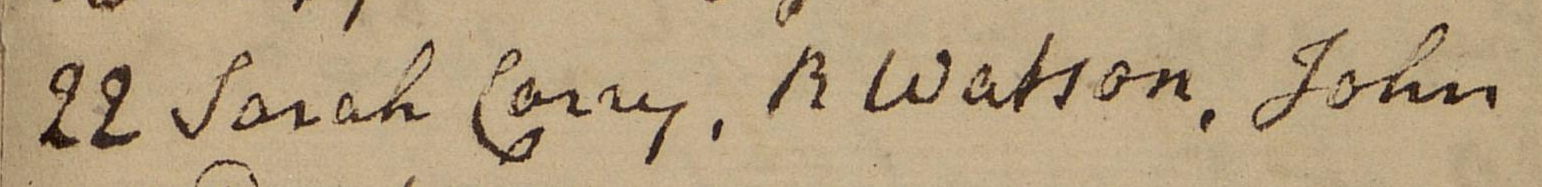22 Sarah Corry, R Watson, John
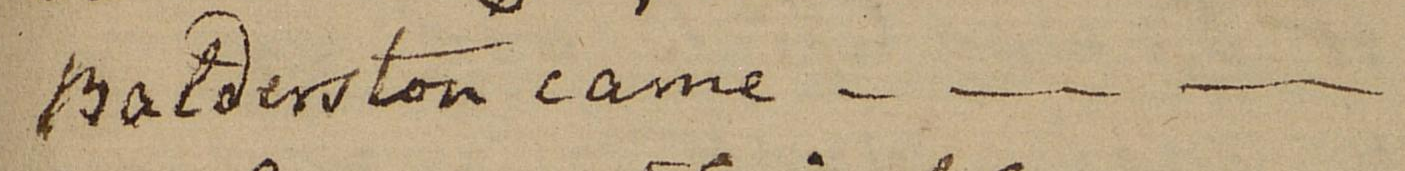Balderston came---
